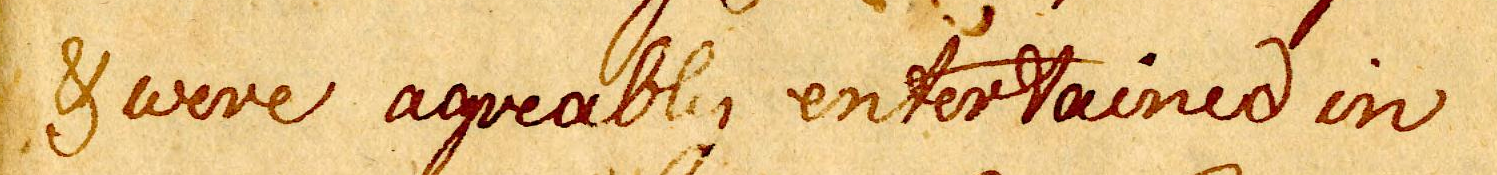& were agreably entertained in
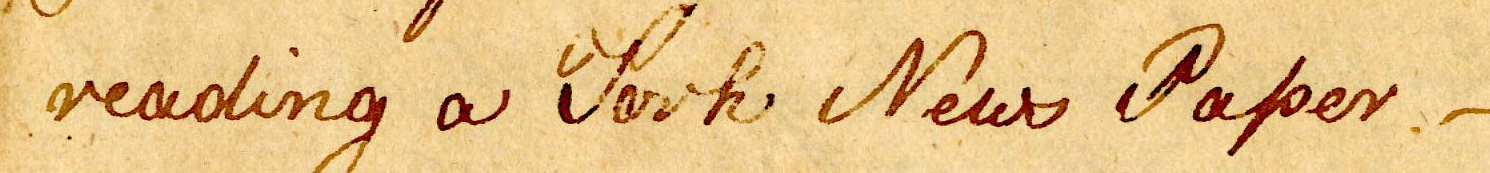reading a York News Paper -
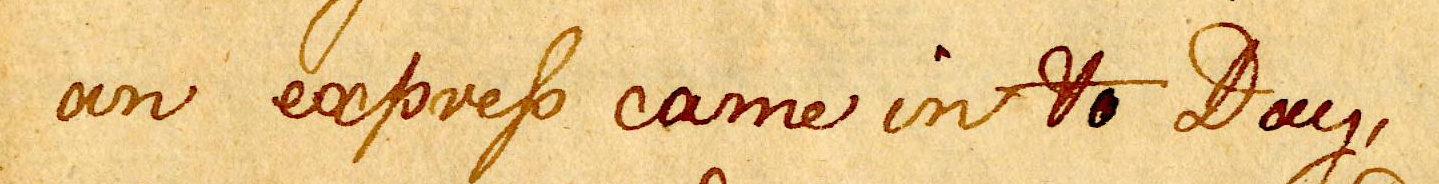an express came in to Day,
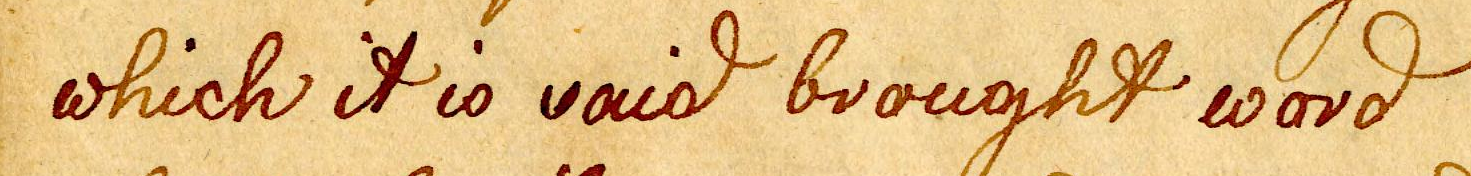which it is said brought word
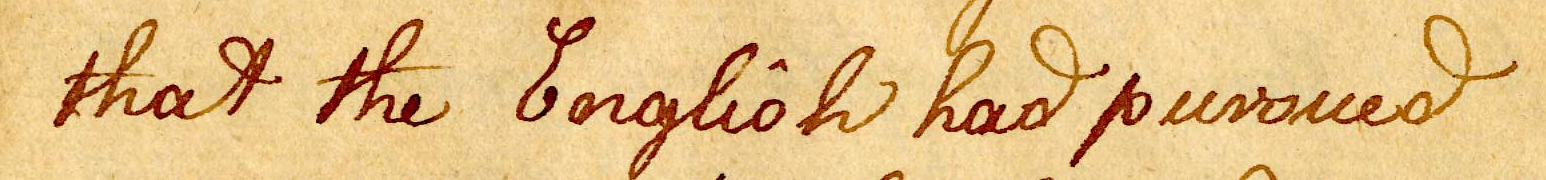that the English had pursued
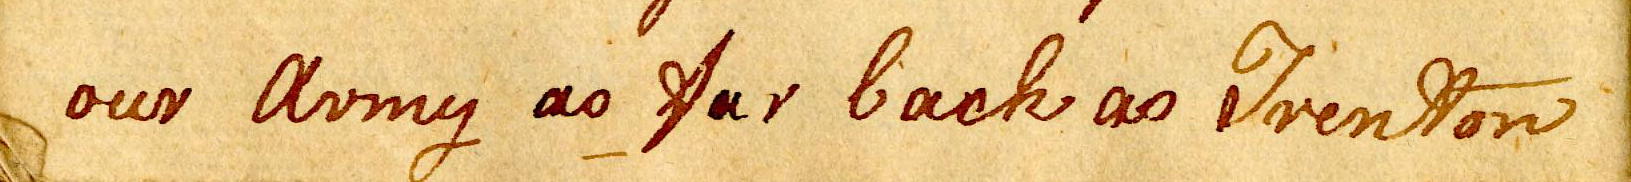our Army as far back as Trenton
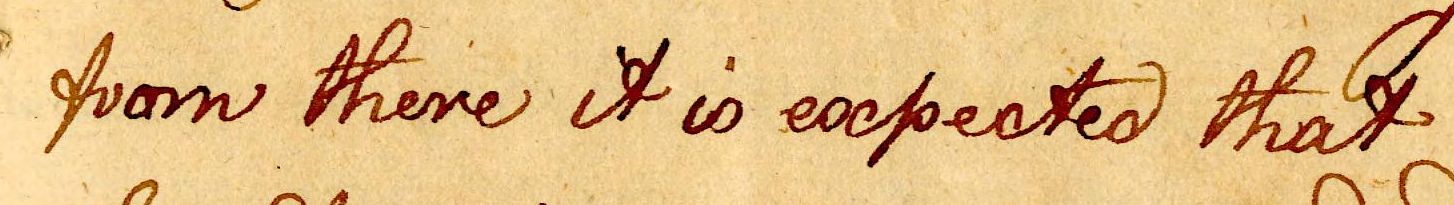from there it is expected that
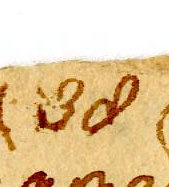38
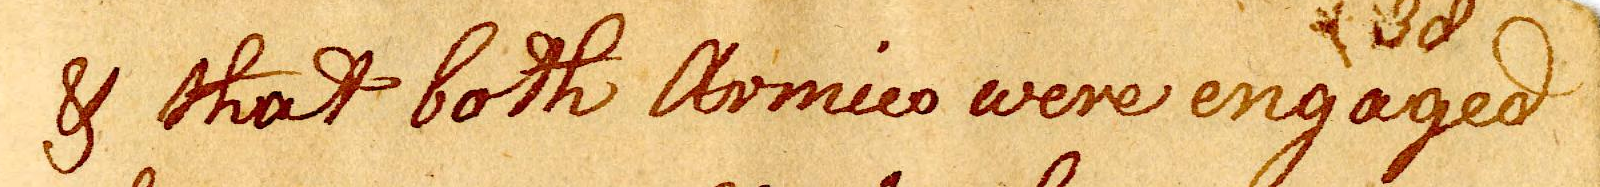& that both Armies were engaged
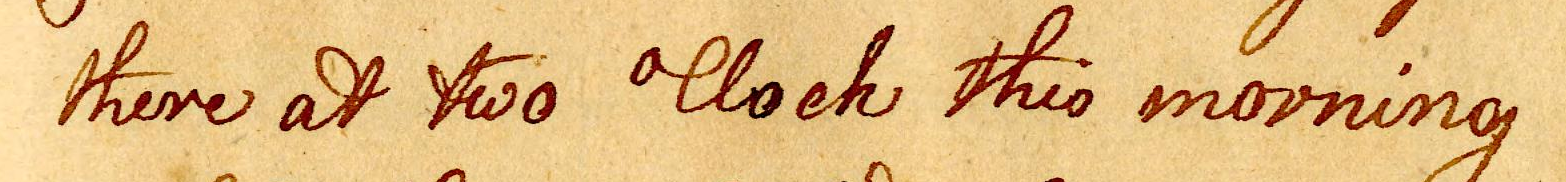there at two ^oClock this morning
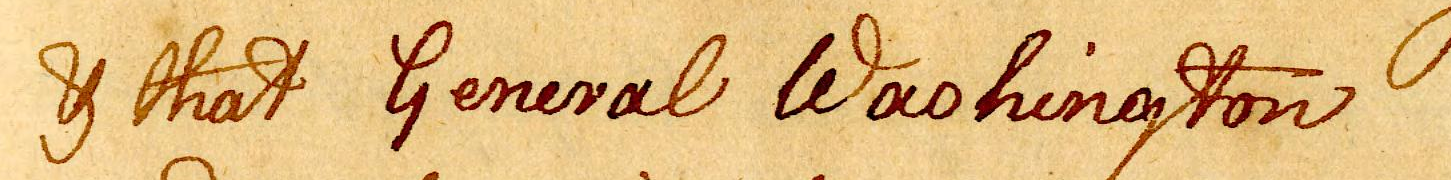& that General Washington
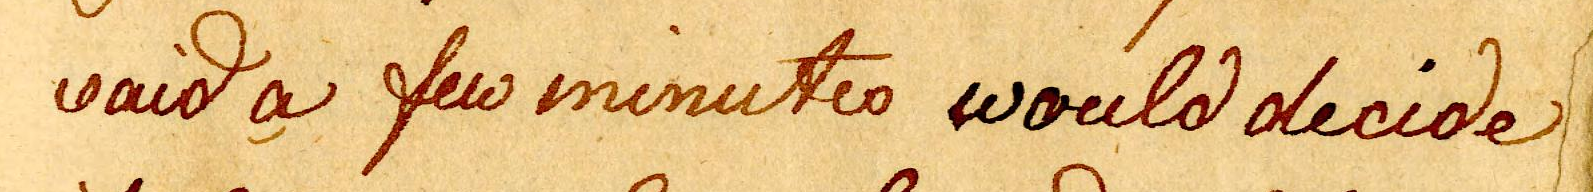said a few minutes would decide
